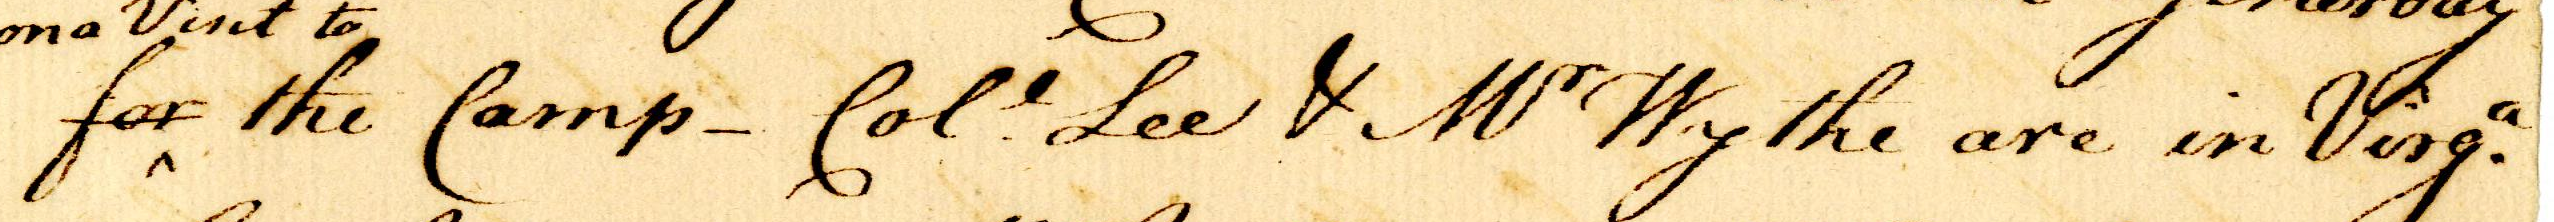for ^ the Camp- Col^o. Lee & M^r Wythe are in Virg^a.
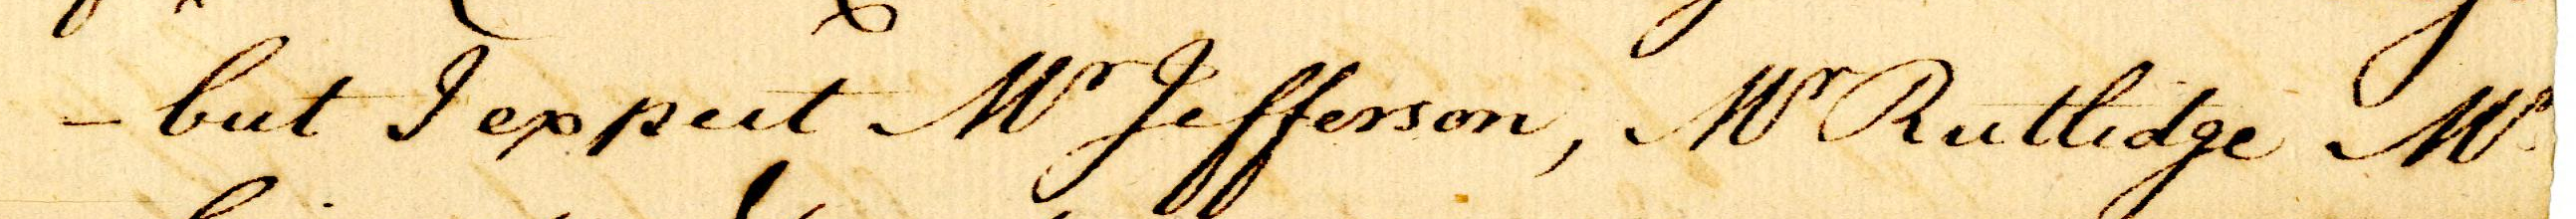- but I expect M^r Jefferson, M^r Rutlidge M^r
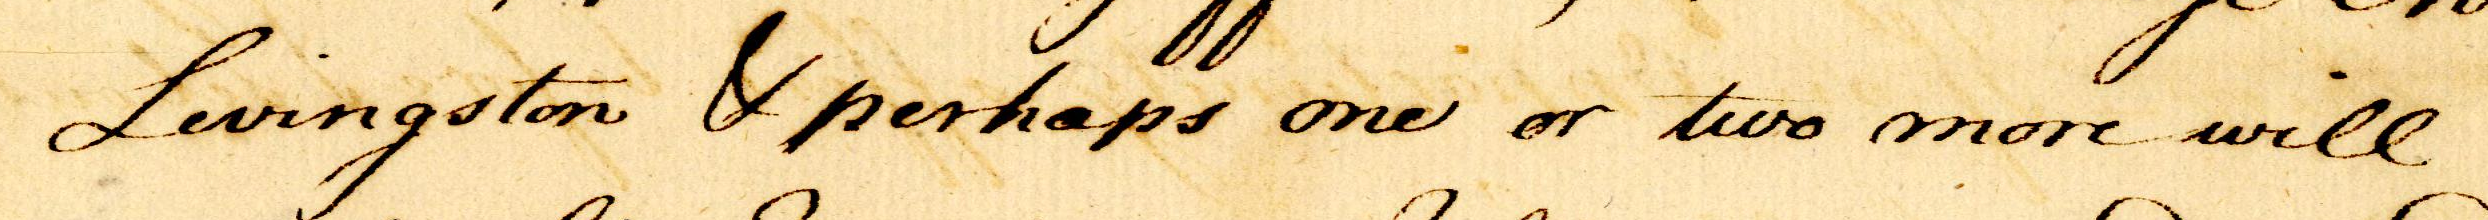Livingston & perhaps one or two more will
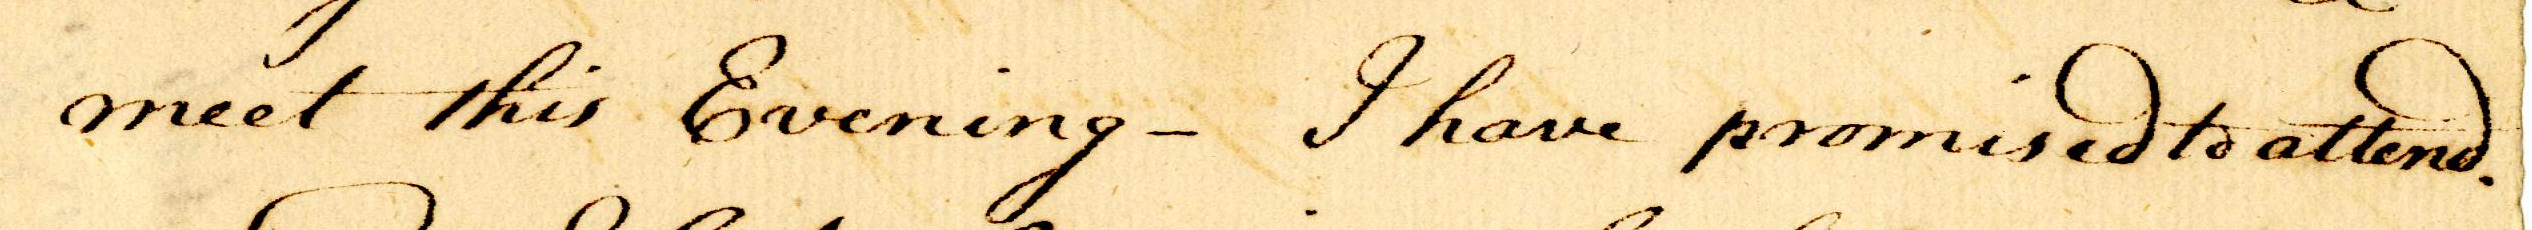meet this Evening- I have promised to attend.
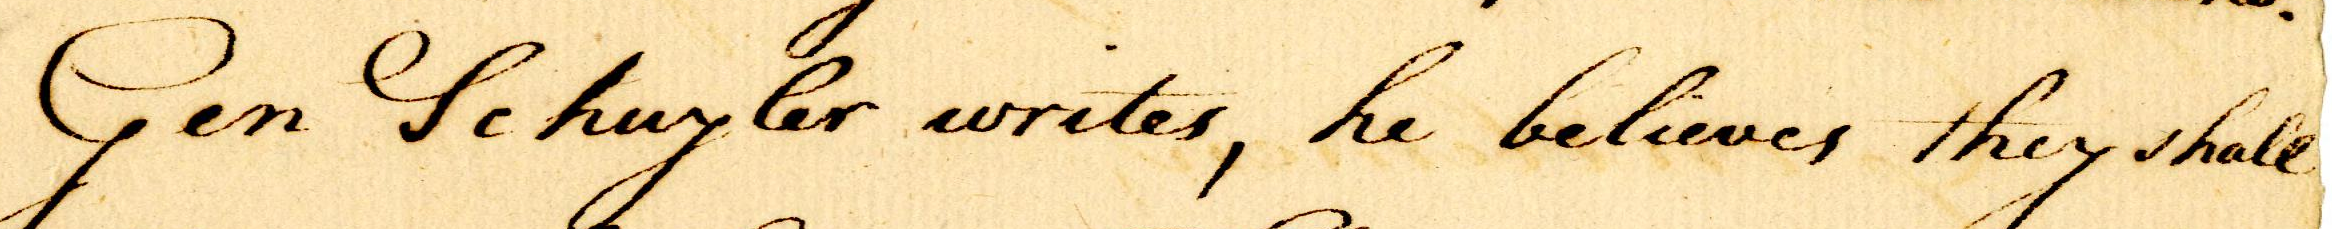Gen Schuyler writes, he believes they shall
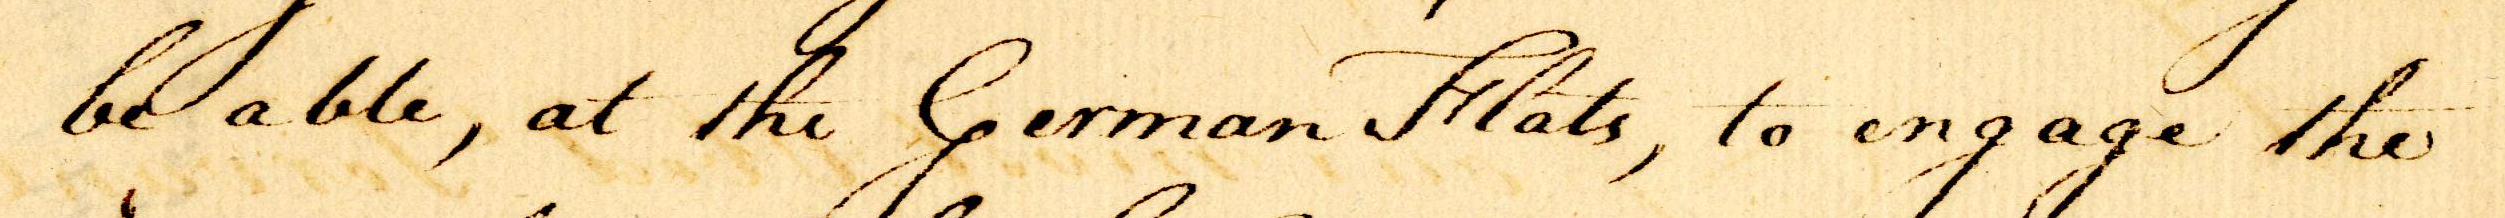be able, at the German Flats, to engage the
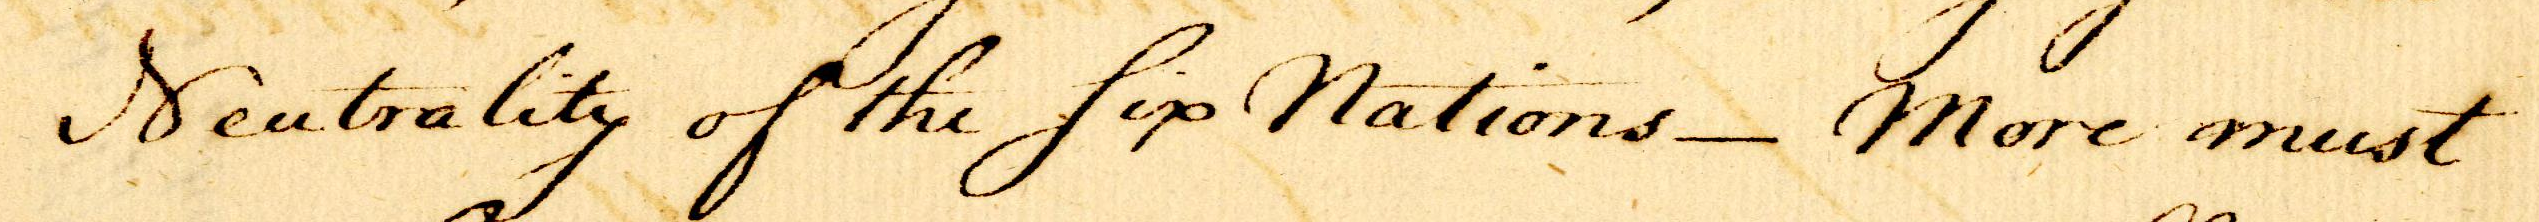Neutrality of the Six Nations- More must
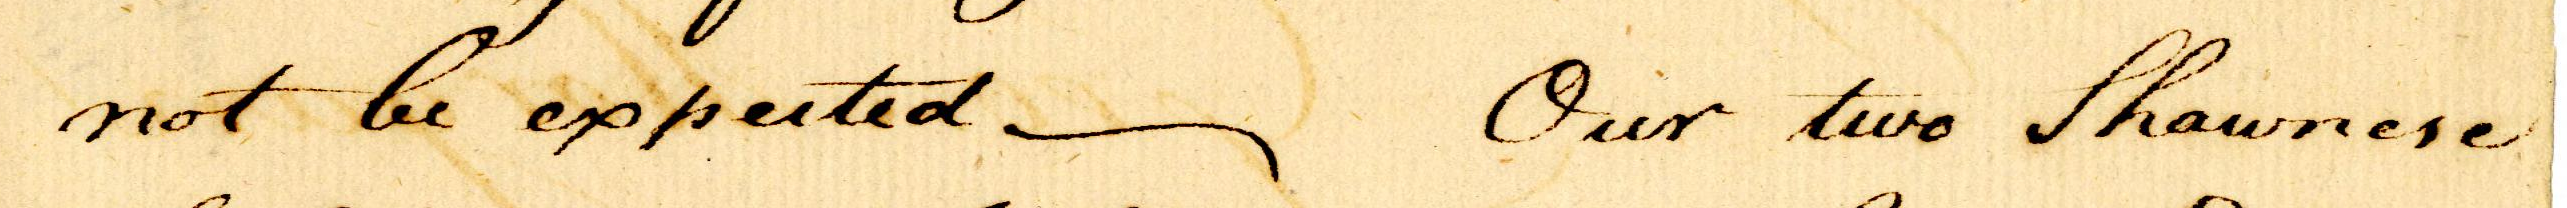not be expected- Our two Shawnese
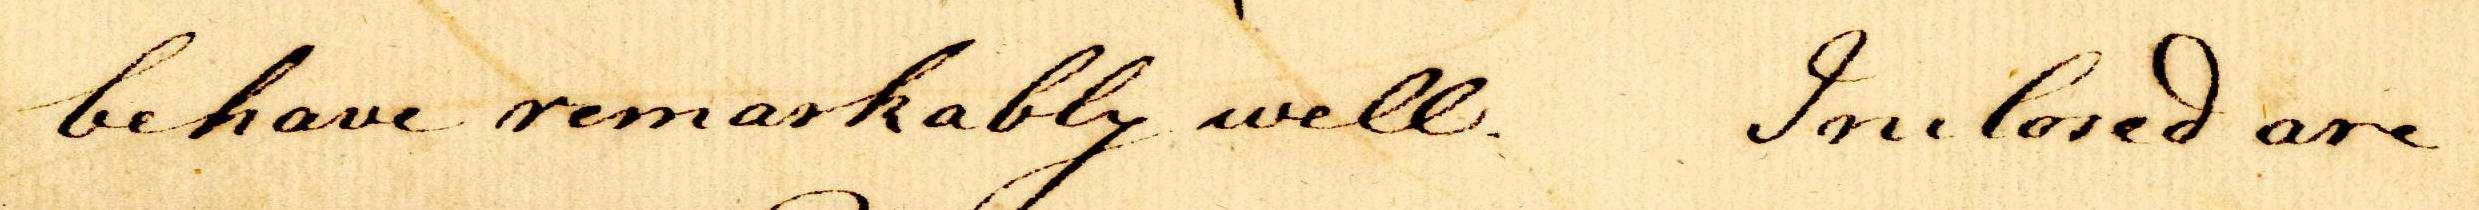behave remarkably well. Inclosed are
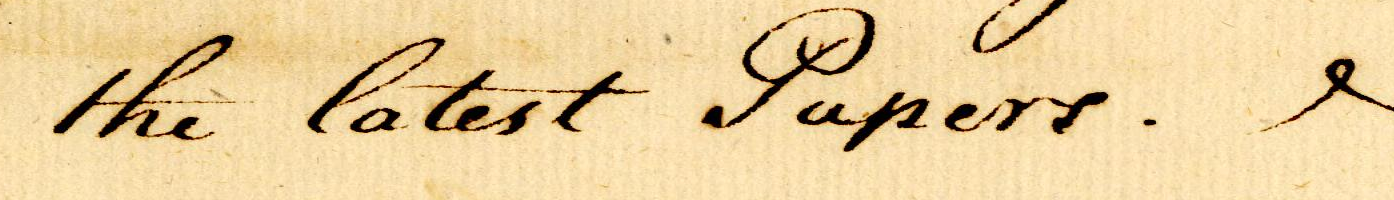the latest Papers.
